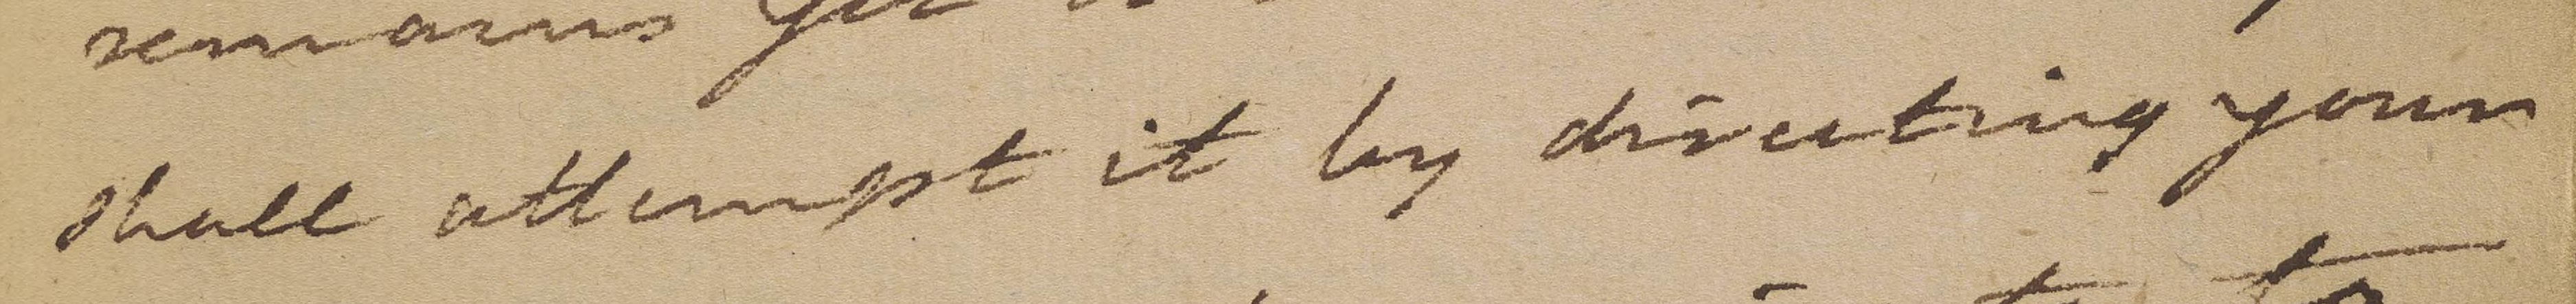shall attempt it by directing your
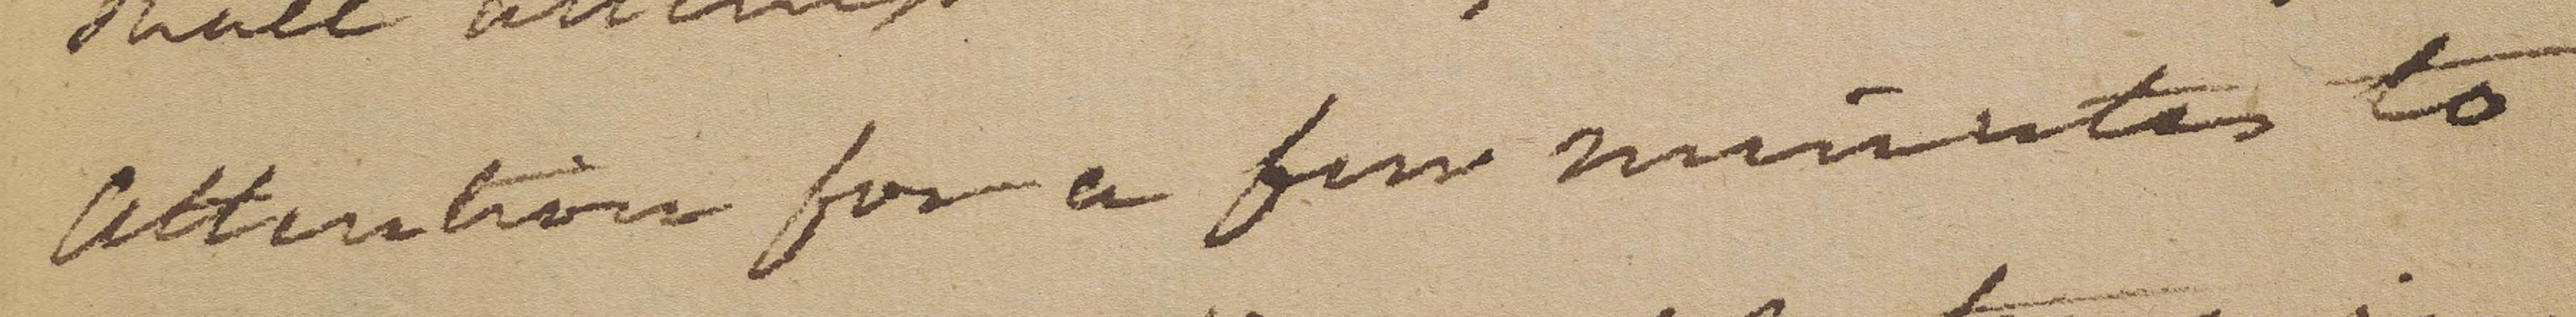Attention for a few minutes to
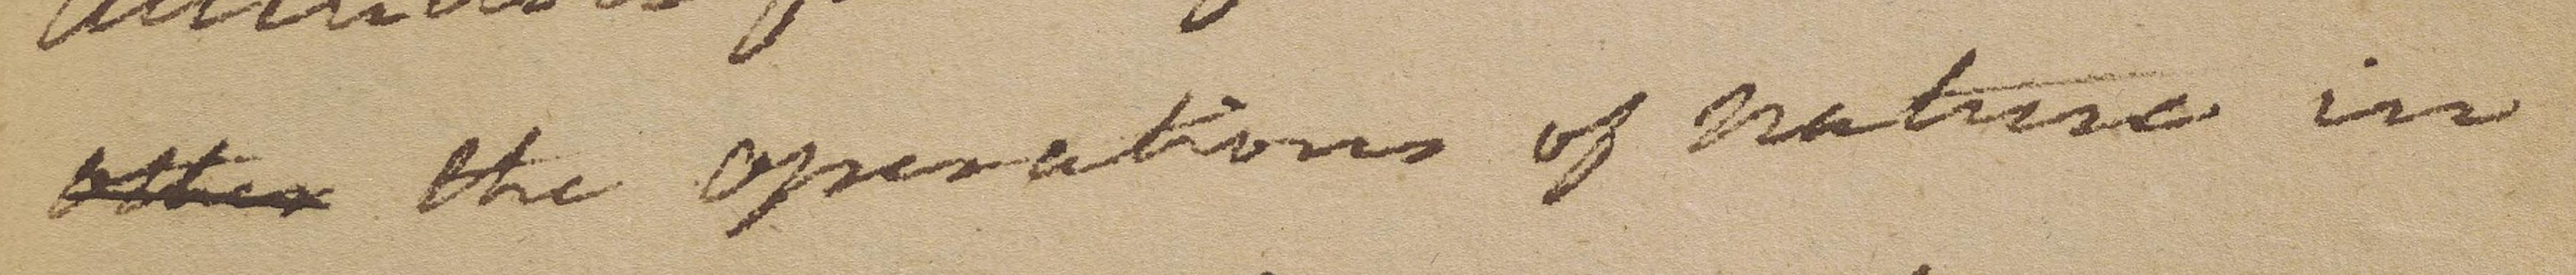[other] the operations of nature in
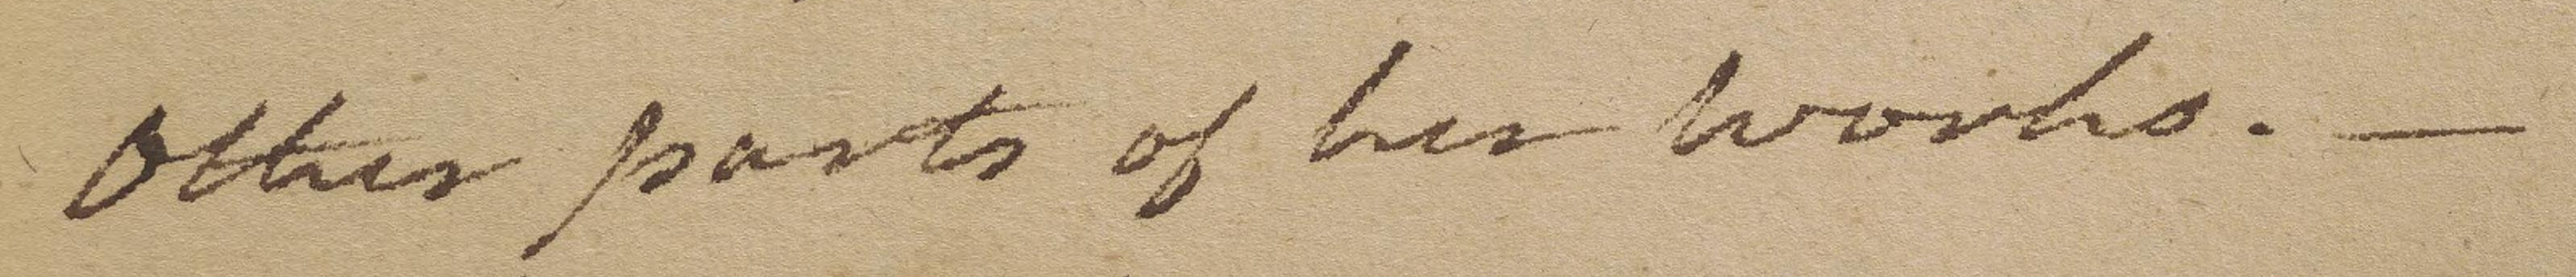Other parts of her works.-
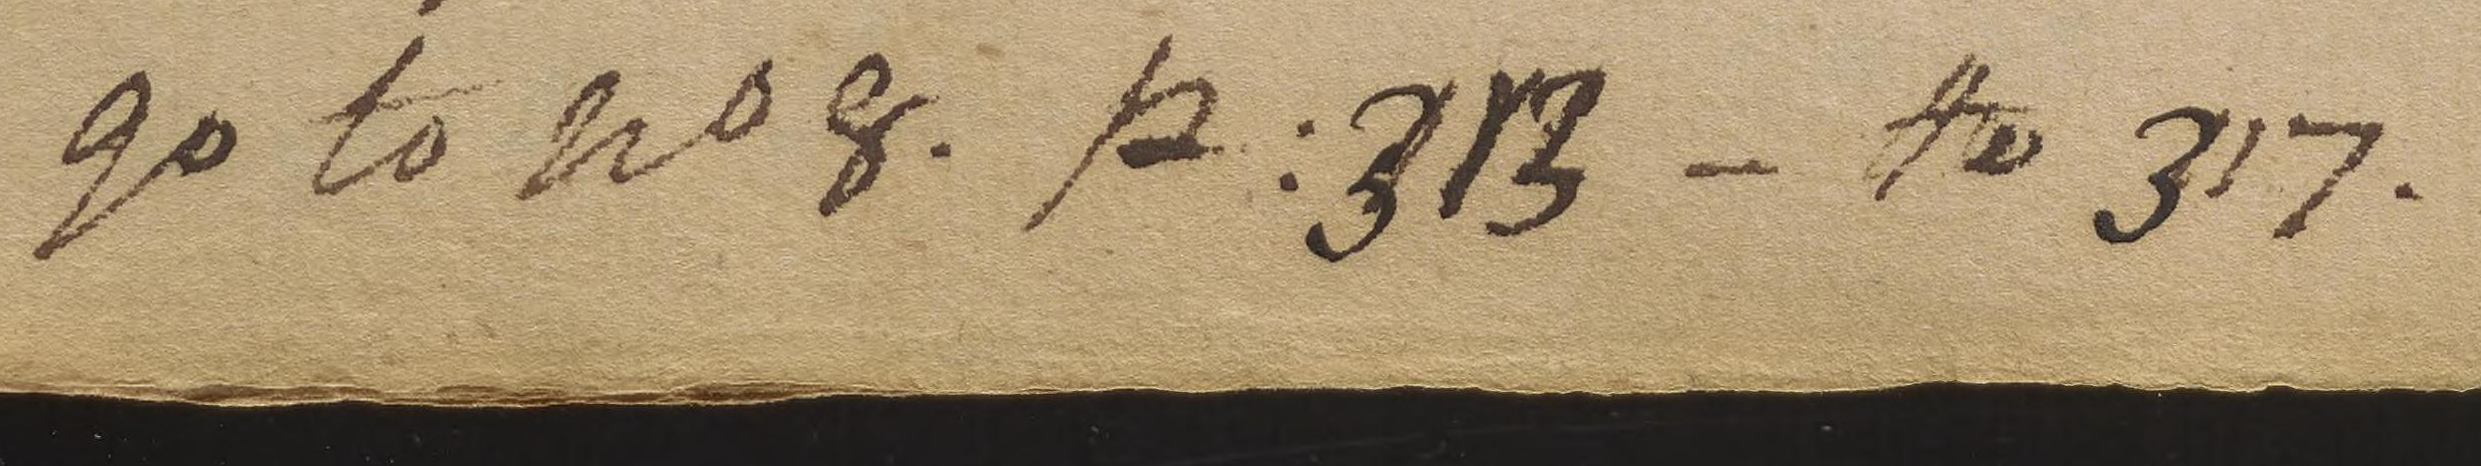go to N^o 8. p. 313, to 317.
